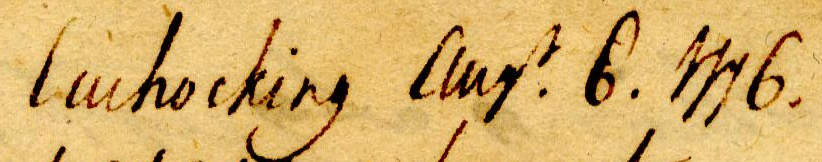Cuchocking Aug^t. 6. 1776.
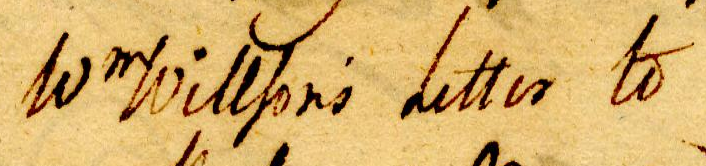W^m Willson's Letter to
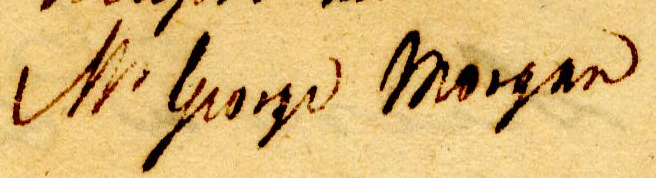M^r George Morgan
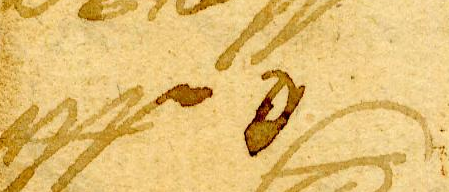To Maj
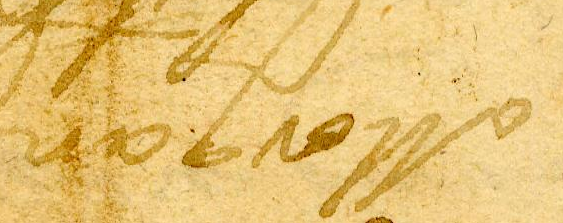Morgan
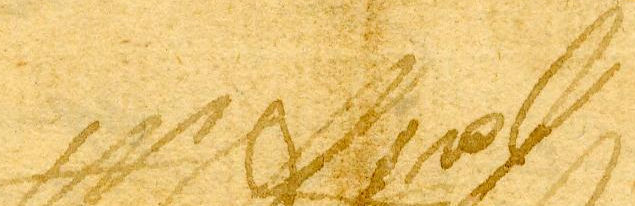fort Pitt
